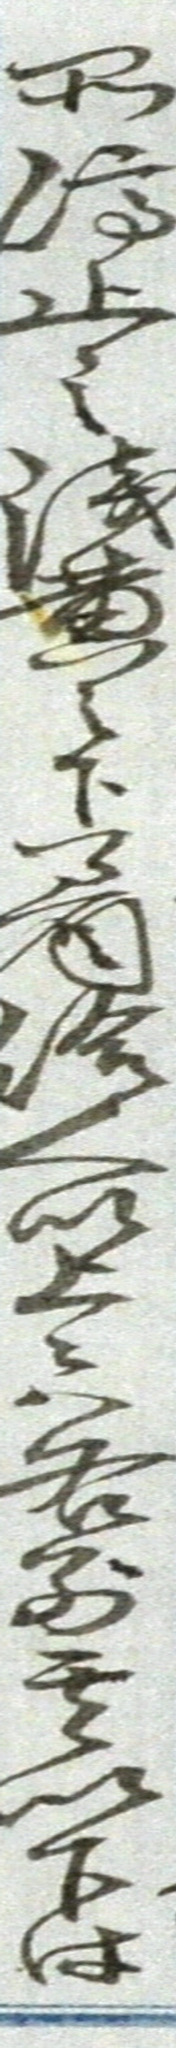品停止之浅黄之下着給人以上には各別其以下は
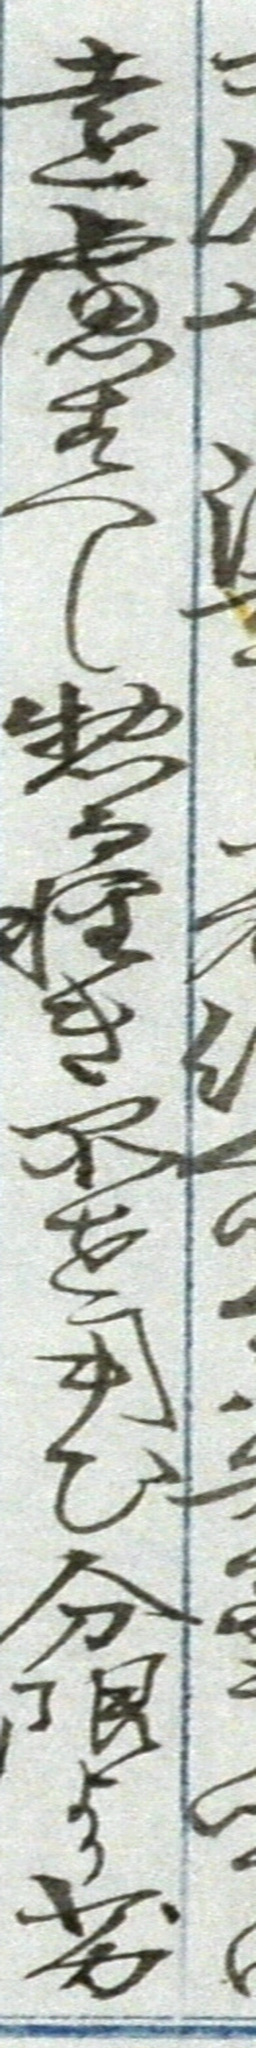遠慮すへし惣而軽き品を用ひ分限より劣
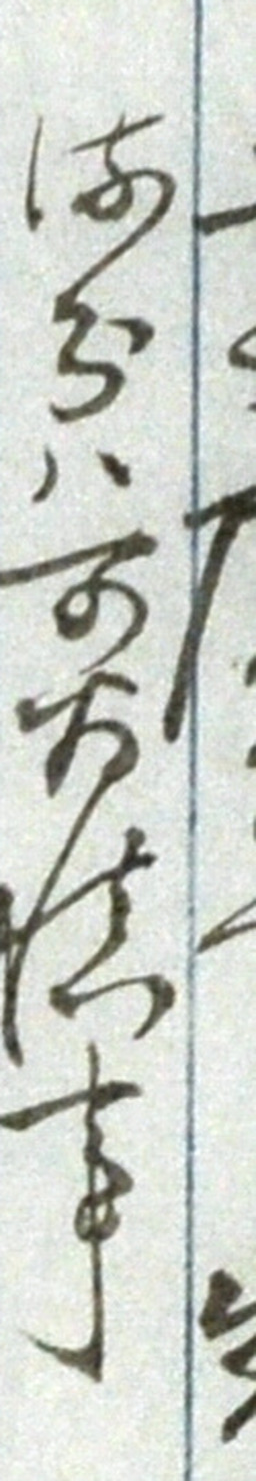る分は可為慎事
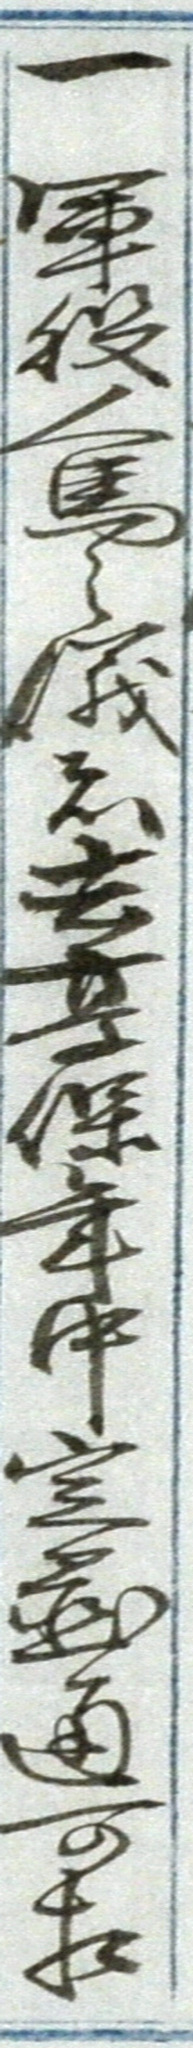一軍役人馬之儀者去享保年中定置通可相
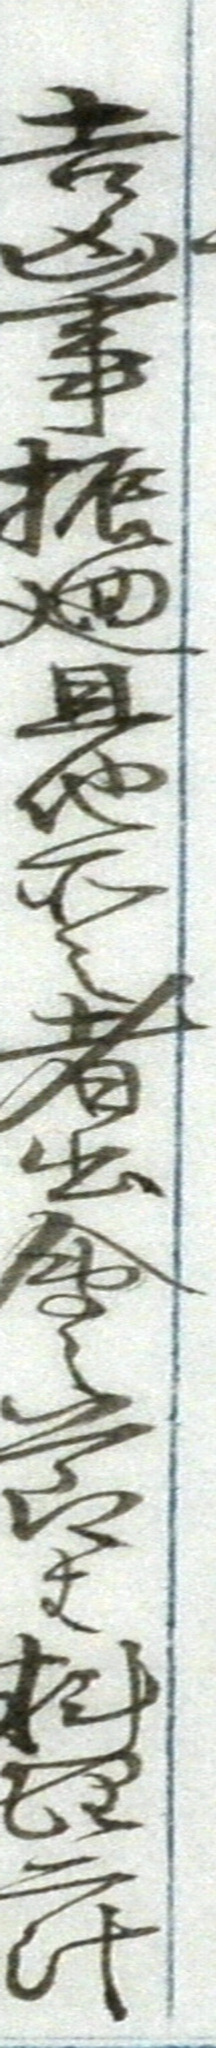一吉凶事振廻且他所之者出会之節は料理二汁
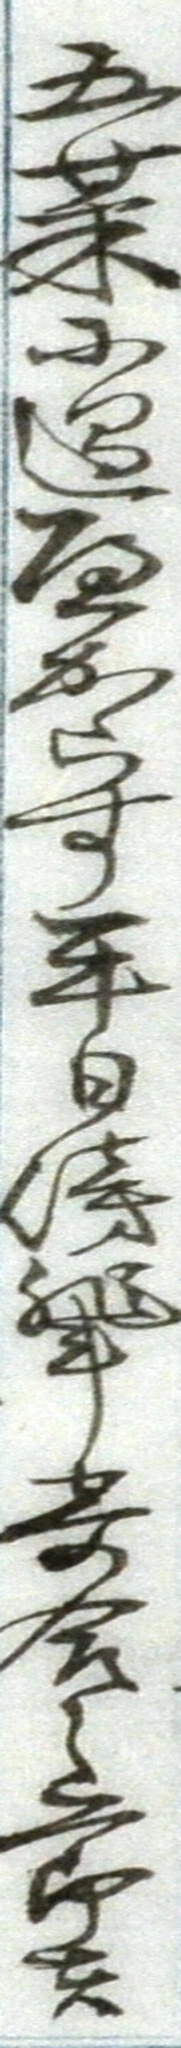五菜に過へからす平日傍輩寄合之節は
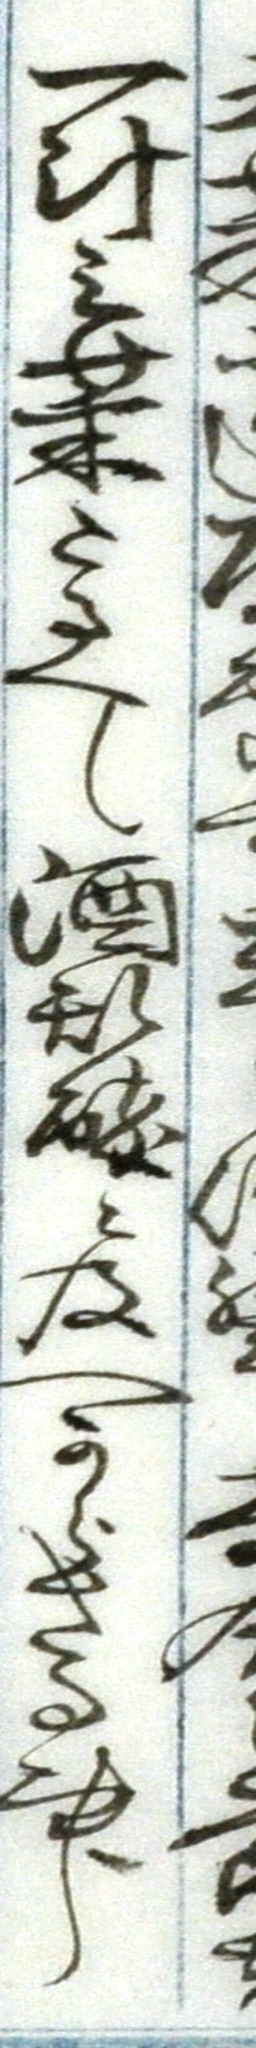一汁三菜たるべし酒乱酔に及ヘからさる事
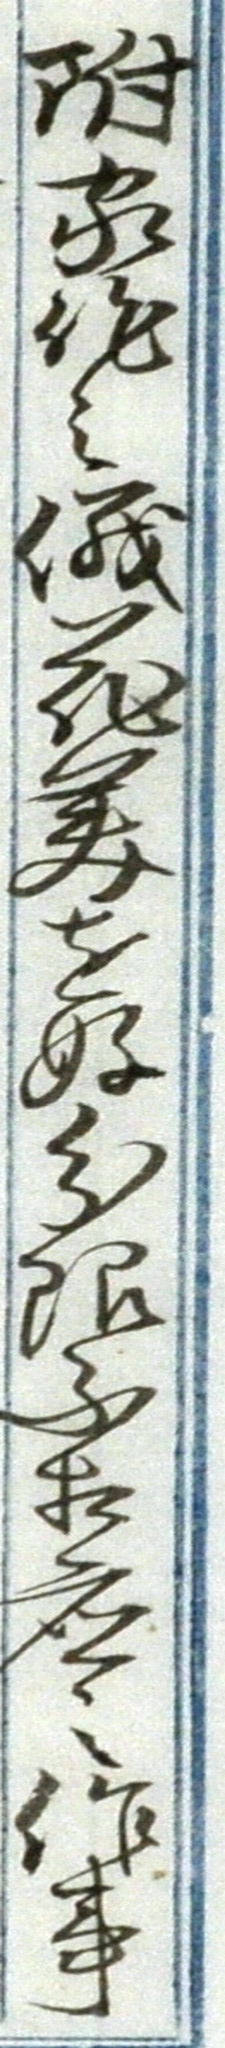附家作之儀花美を好分限不相応之作事
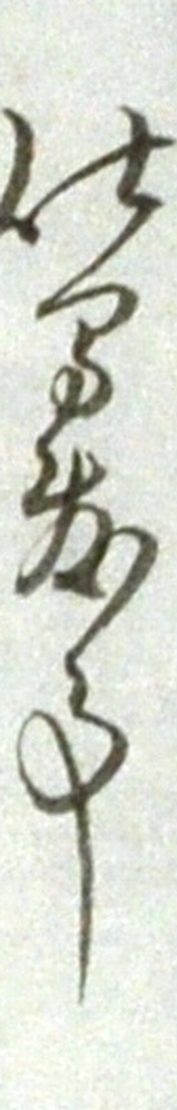仕間敷事
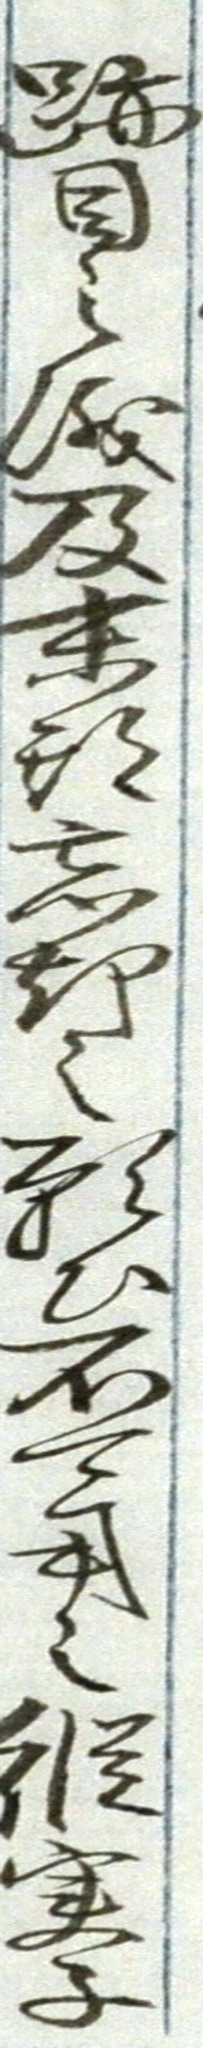一跡目之儀及末期忘却之願ひ不可用之縦実子
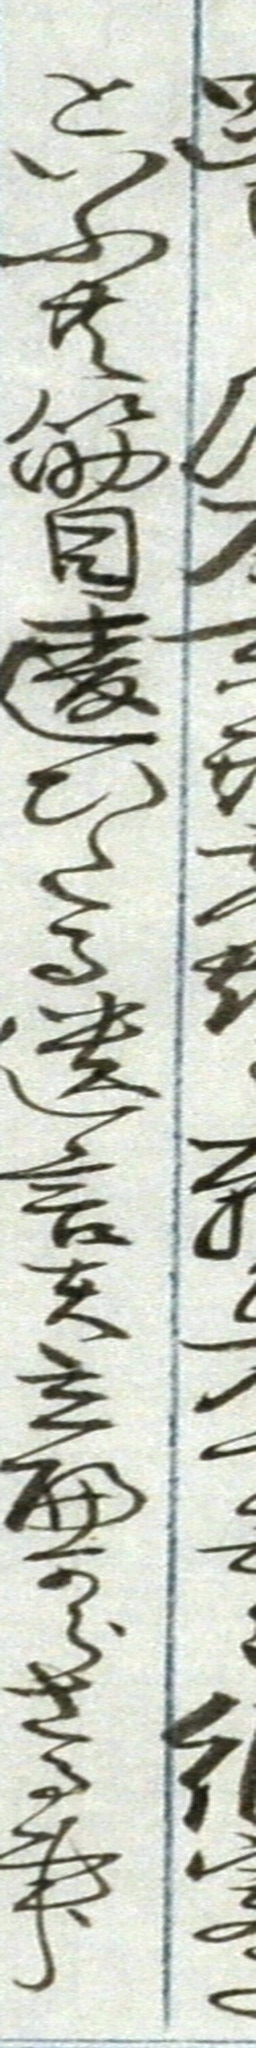といふ共筋目違ひたる遺言者立へからさる事
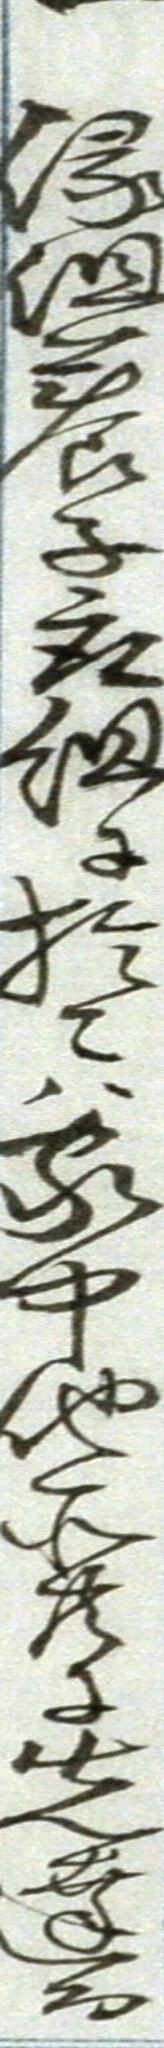一縁組養子取組に於ては家中他所共に先達而
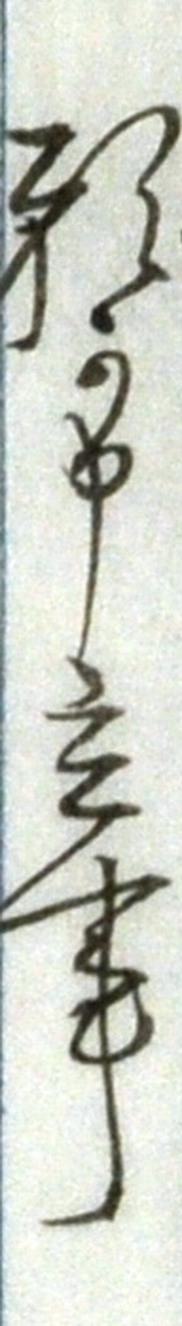願可申立事
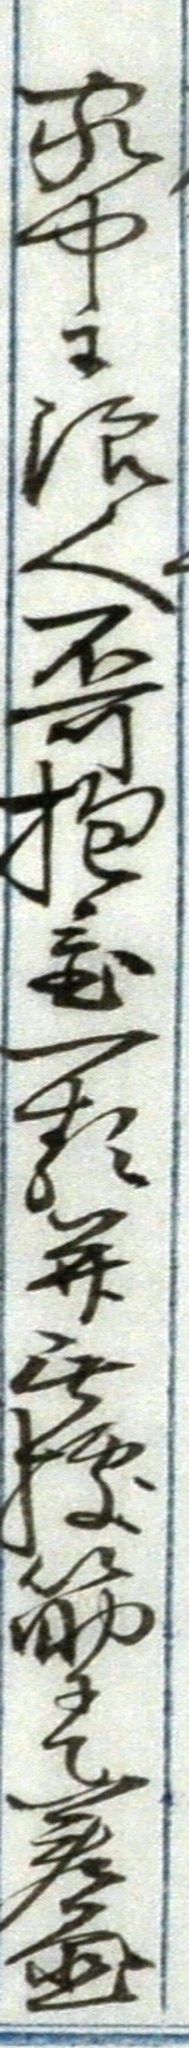一家中に浪人不可抱置一類并無拠筋にて差置
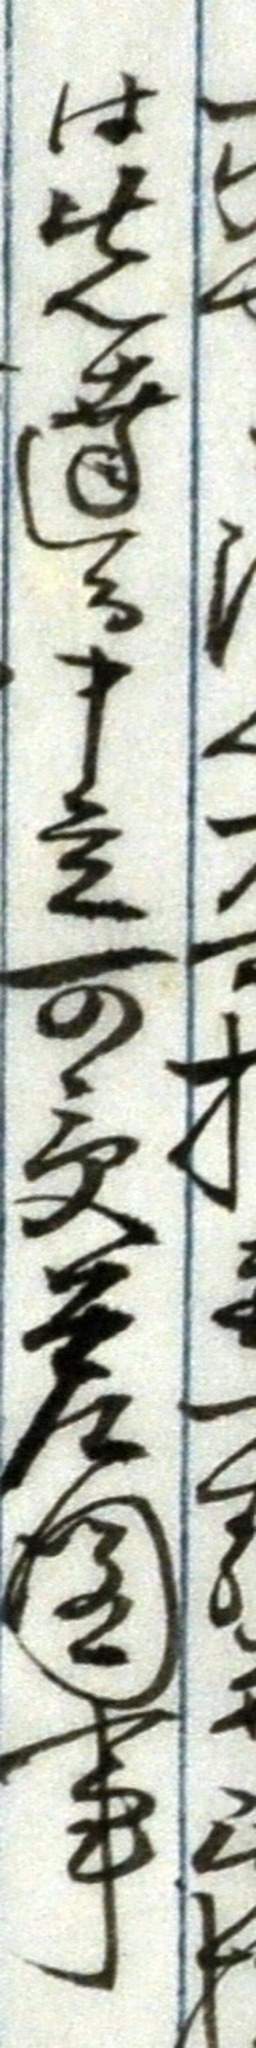は先達而申立可受差図事
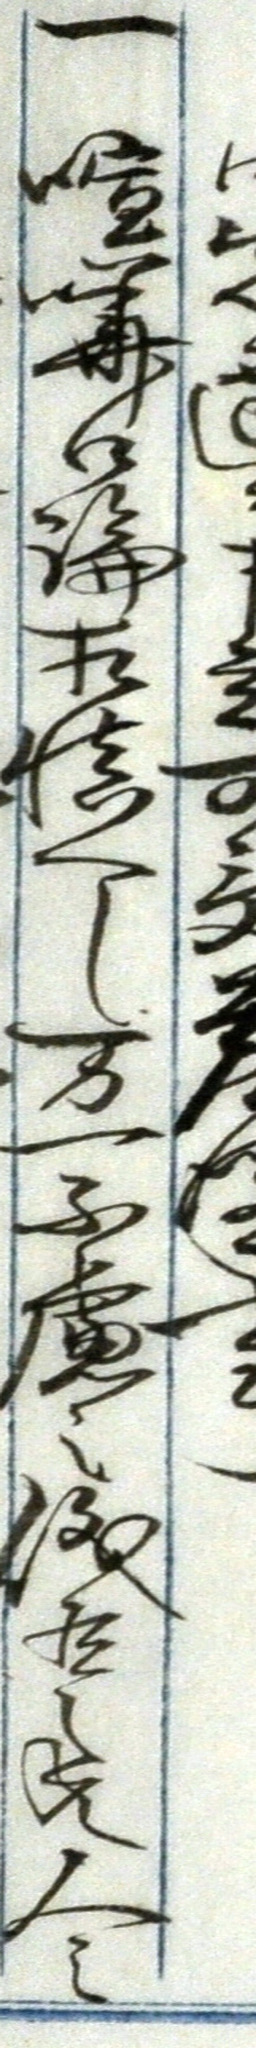一喧嘩口論相慎へし万一不慮之儀有之共人之
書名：頼由公御定之条々
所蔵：伊那市立高遠町図書館・合同会社AMANE
